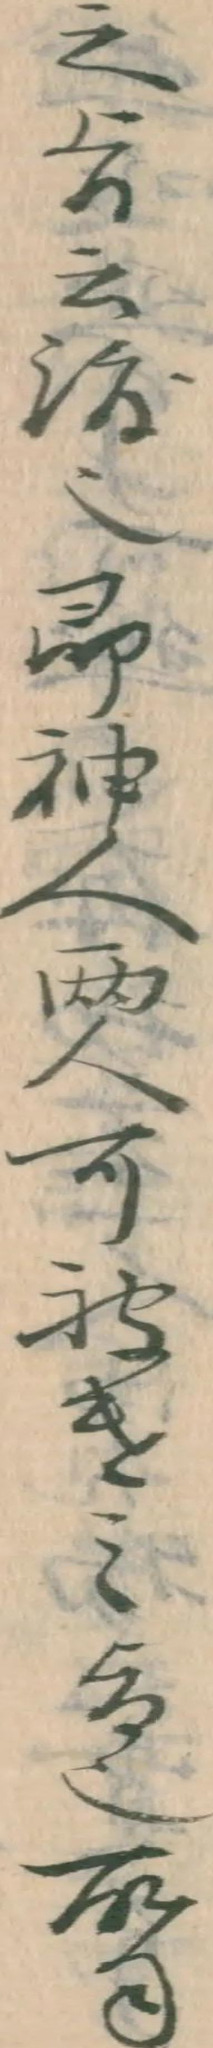之旨云渡也即神人両人可被遣之旨也所司
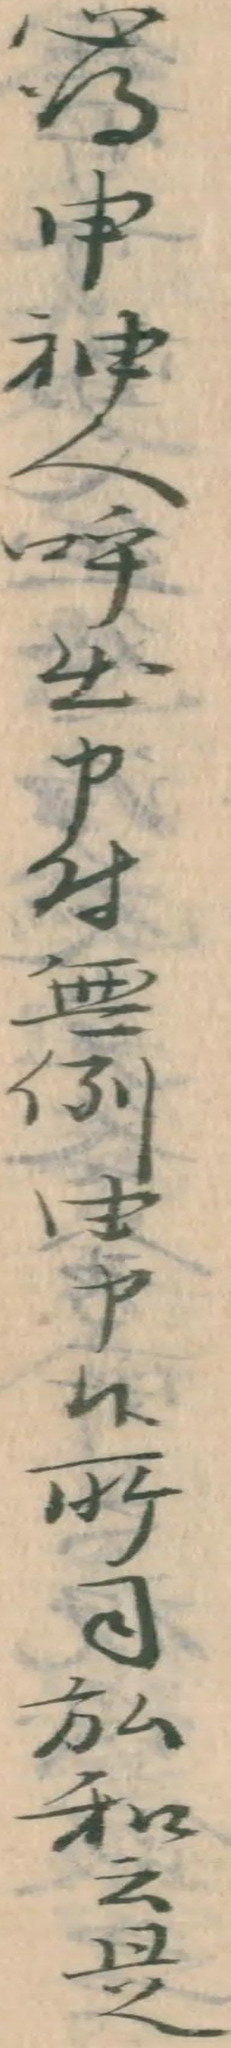心得申神人呼出申付無例由申候所司私和云是
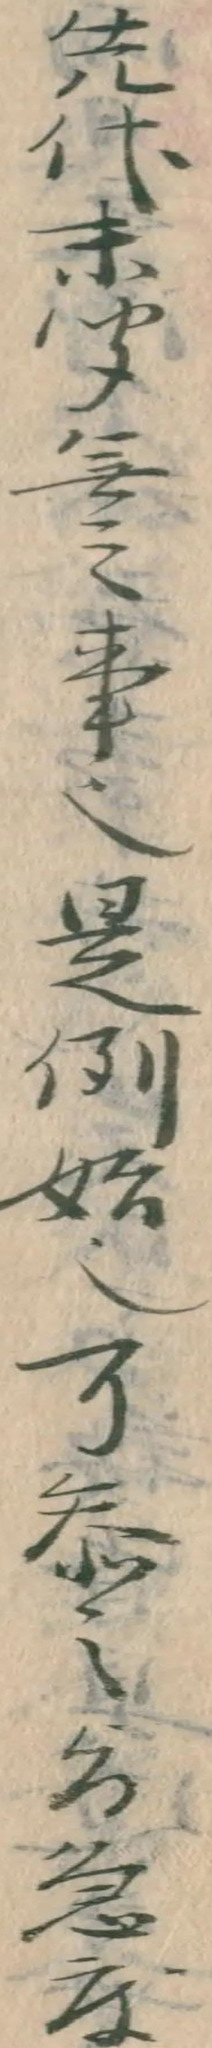先代未聞無之事也是例始也可参之旨急度
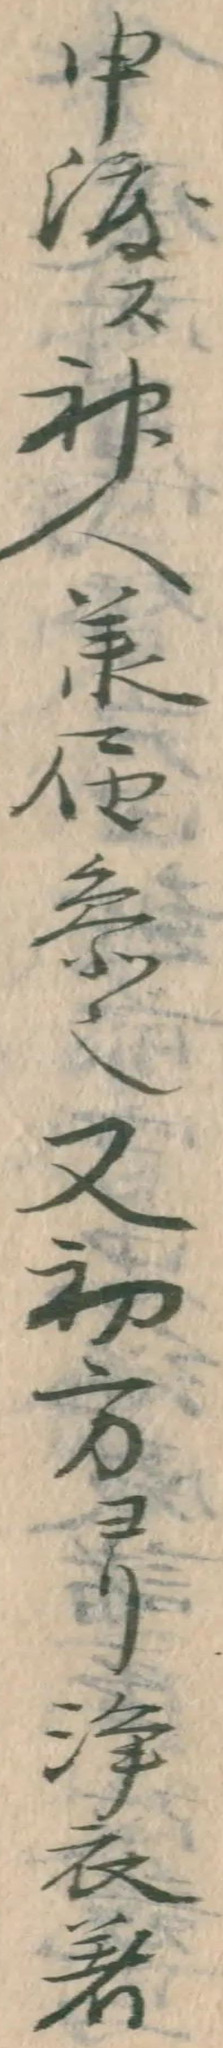申渡ス神人承届参也又初方ヨリ浄衣着
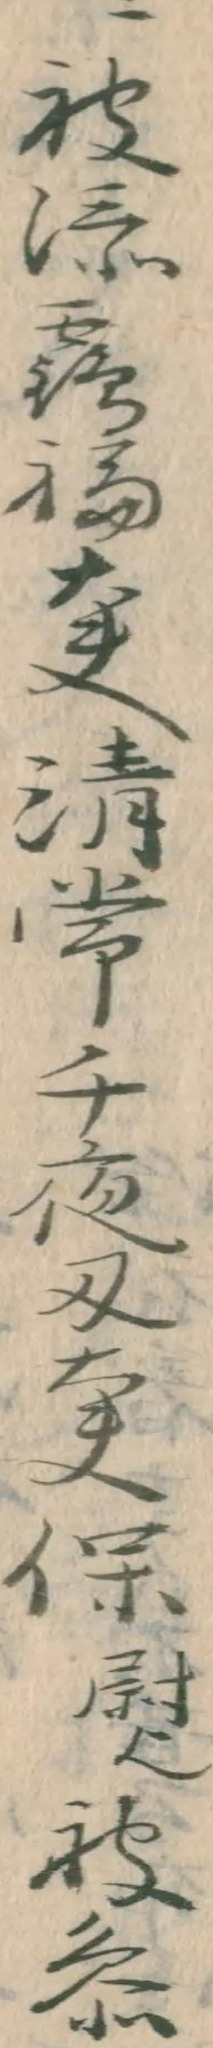ニ被添露福大夫清常千夜刃大夫保尉歟被参
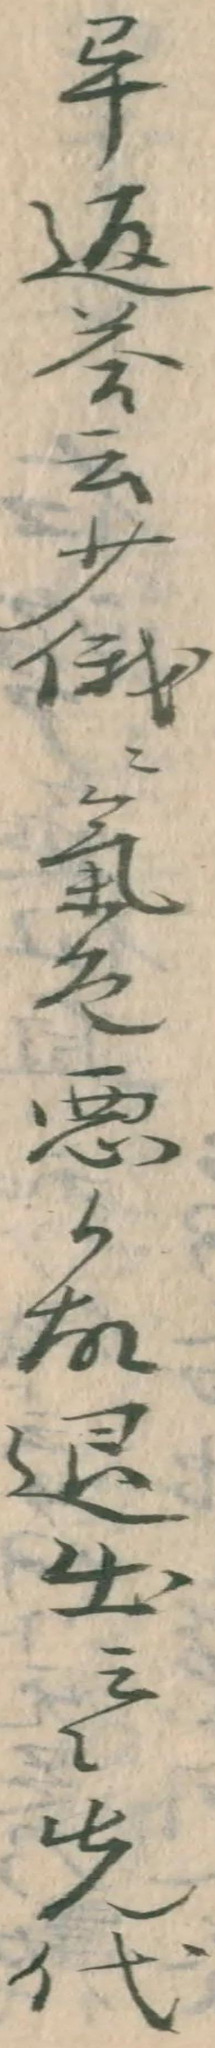畢返答云少俄ニ気色悪候故退出云々先代
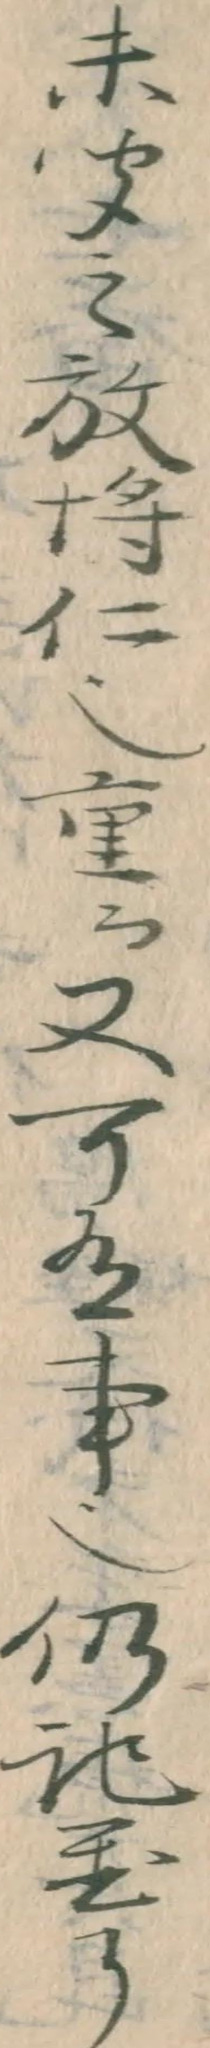未聞之放埒仁也重而又可有事也仍記置了
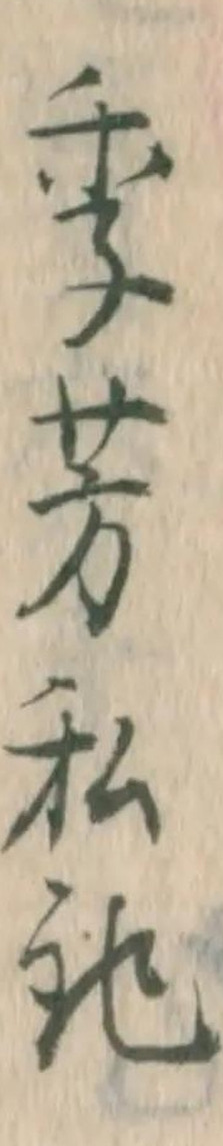季芳私記
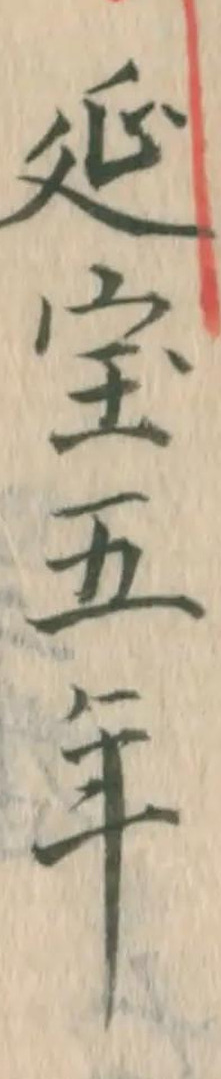延宝五年
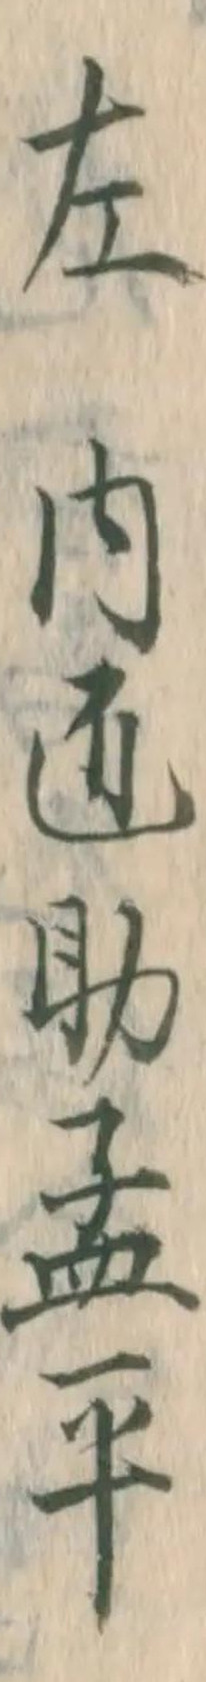左内匠助孟平
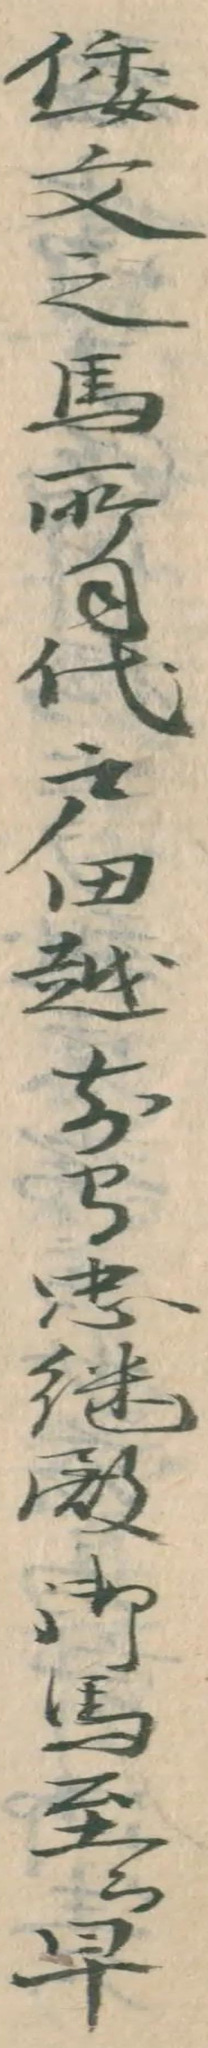倭文之馬所司代戸田越前守忠継殿御馬至而早

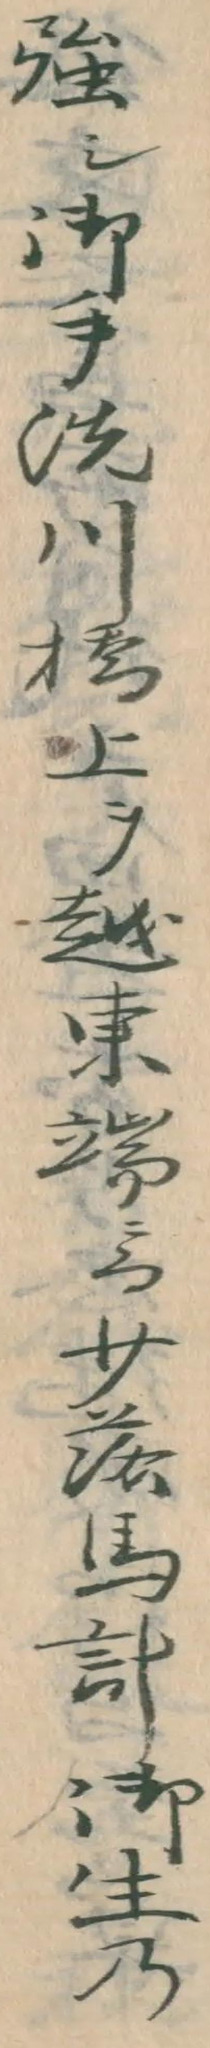強シ御手洗川橋上ヲ越東端ニ而少落馬計御生乃
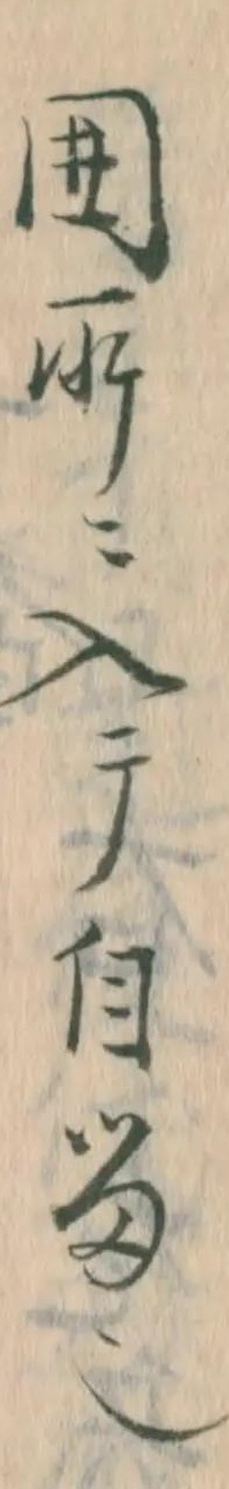囲所ニ入テ自留也
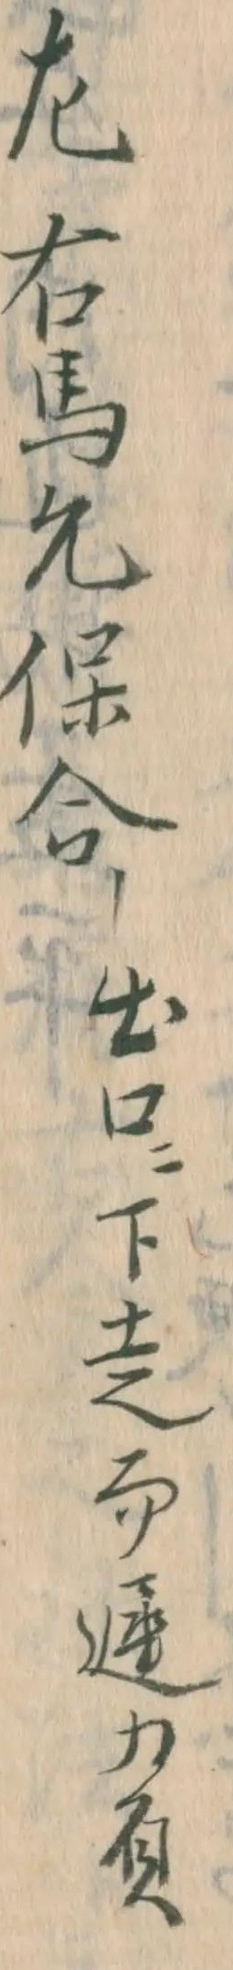左右馬允保合-出口ニ下走而遅為負
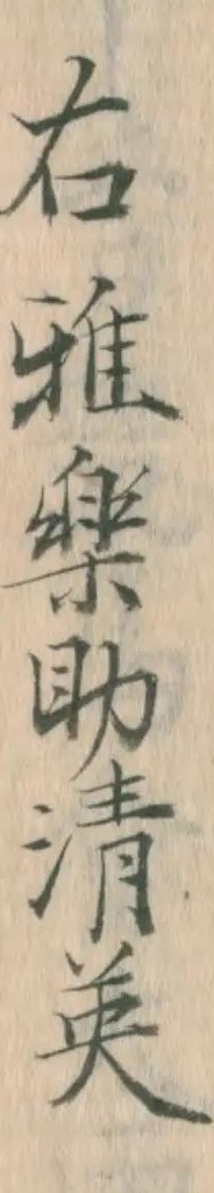右雅楽助清英
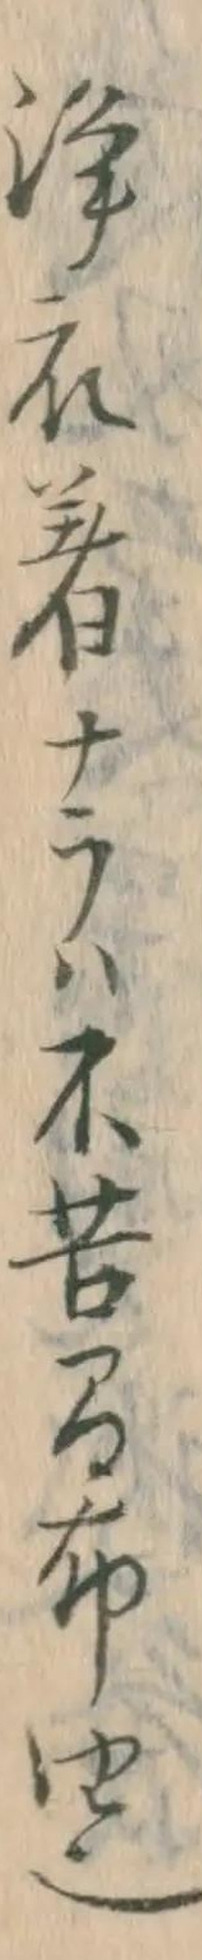浄衣着ナラハ不苦間布由也
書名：賀茂社記録. 第10冊
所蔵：国立国会図書館 National Diet Library, JAPAN
